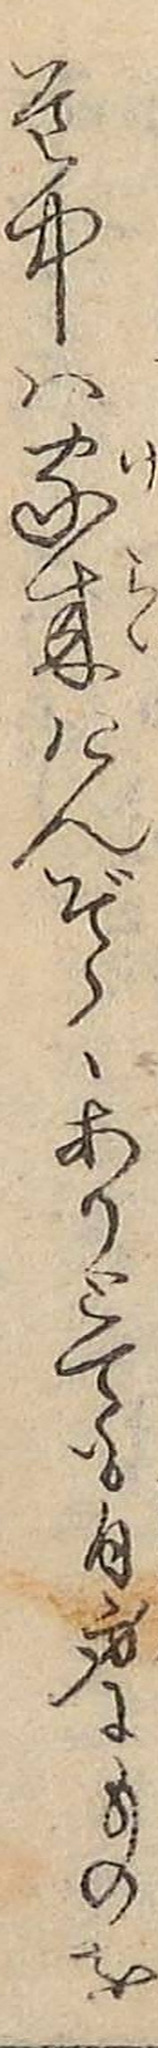道中は家来けんぞくありとても自身にものを
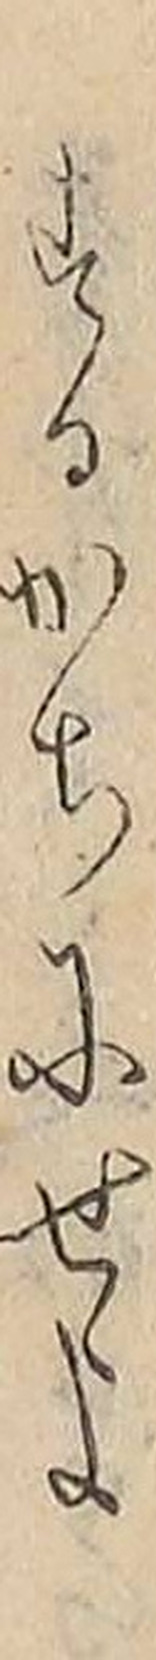するかちにせよ

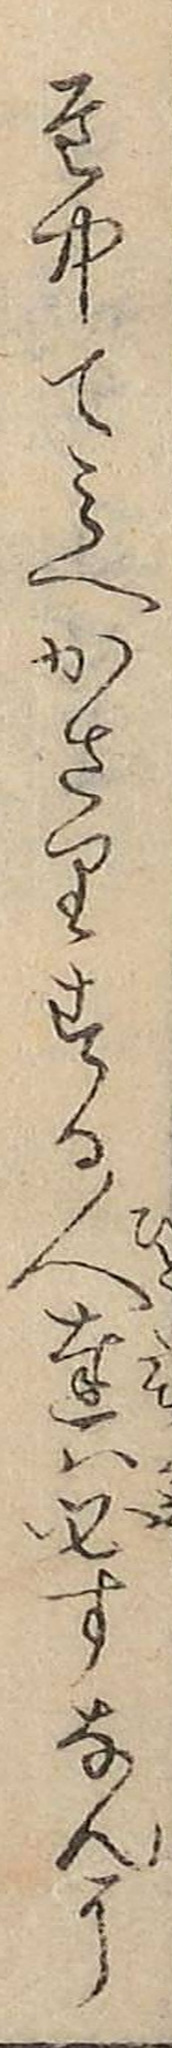道中てみへかさりする人達は必すなんに
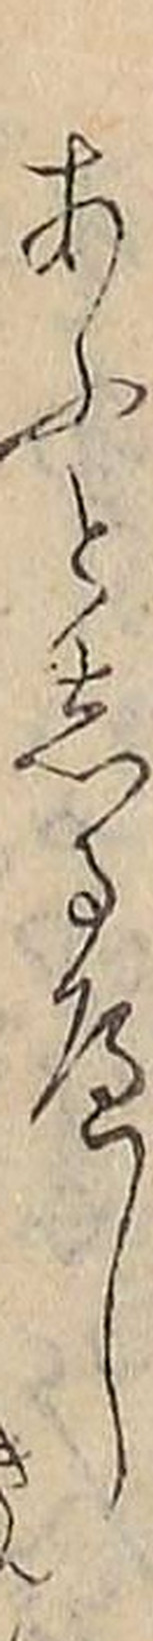あふとしるへし
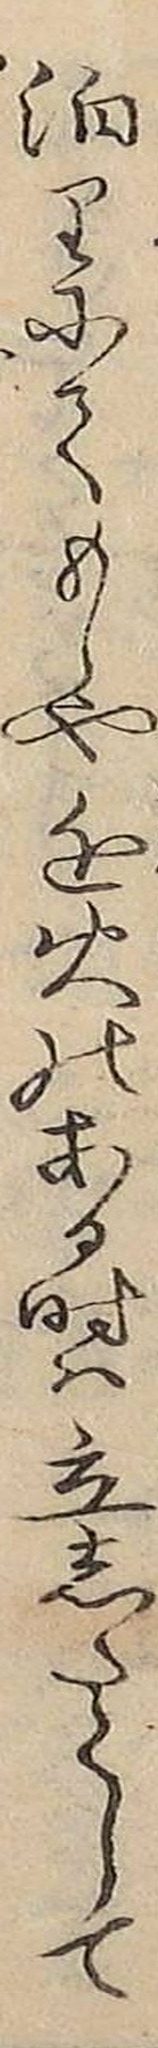泊りにてもしや近火のある時は立したくして
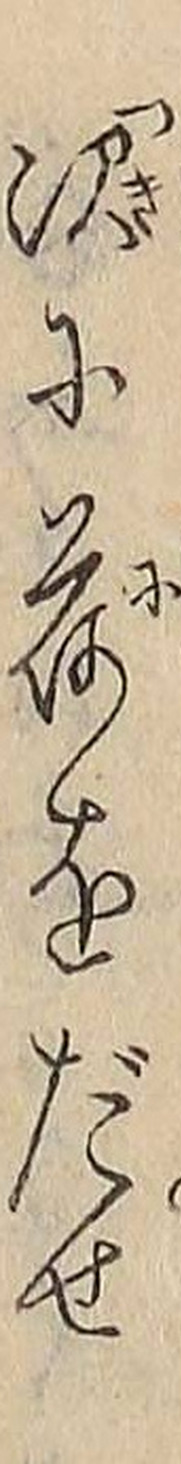次に荷をだせ
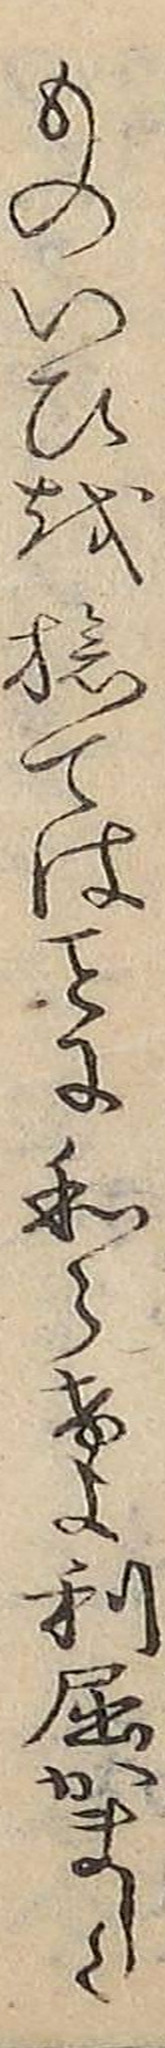ものいひを旅てはことに和らけよ利屈かましく
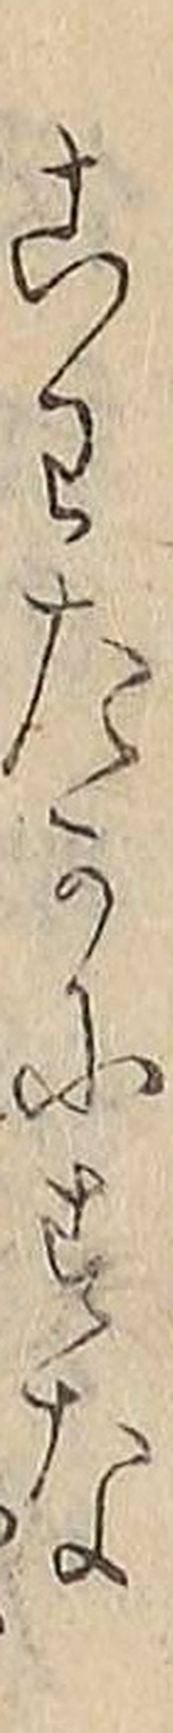こわたかにすな
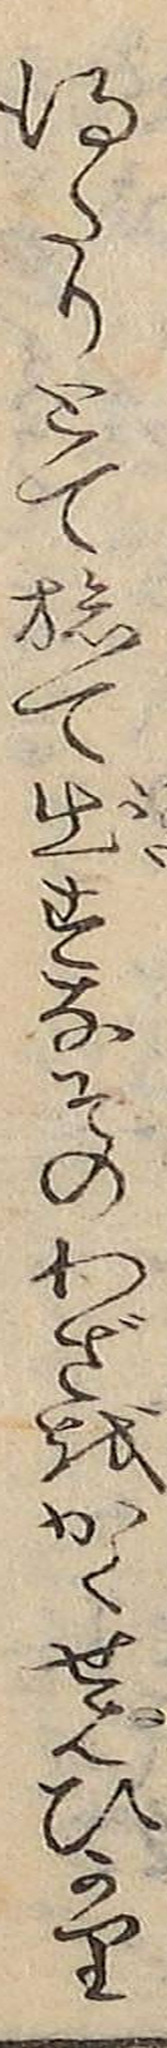得たりとて旅て出すなそのわざをかくせはひかり
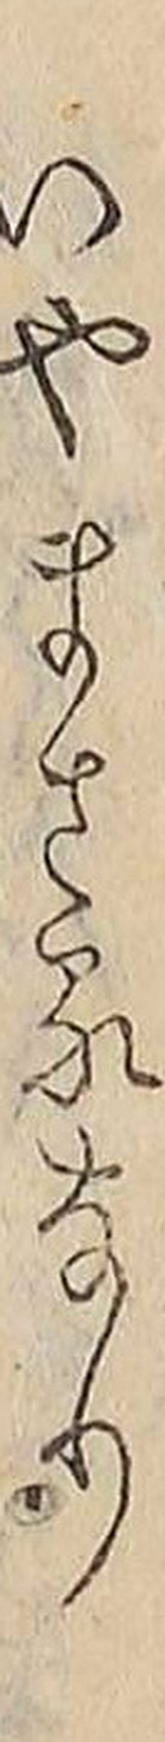いやまさるなり
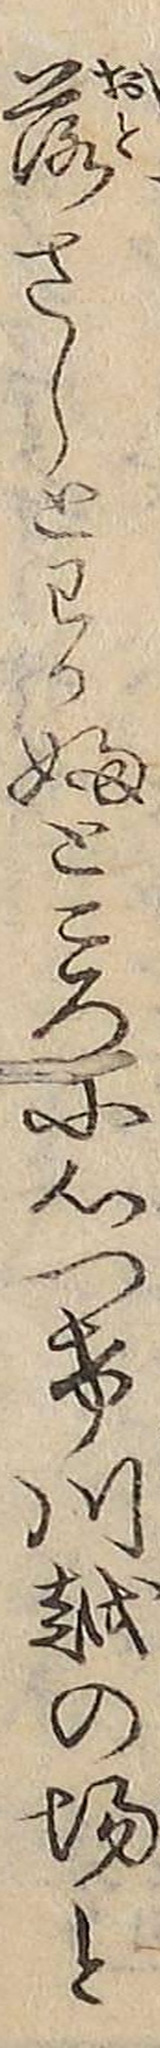落さしとわかふところに心つけ川越の場と
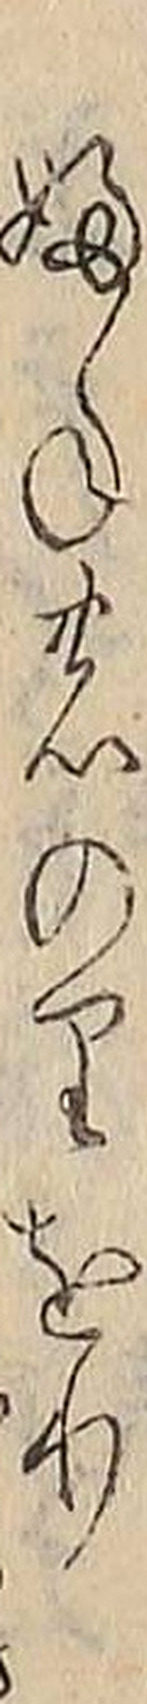ふねののりをり
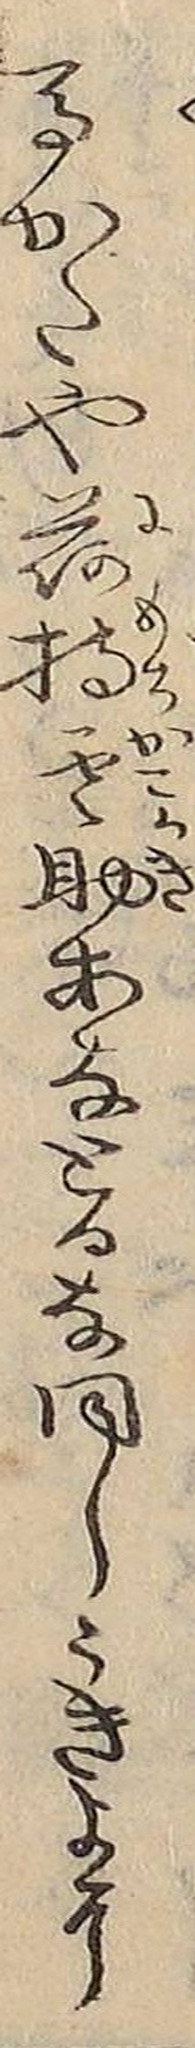馬かたや荷持雲助あなとるな同しうきよに
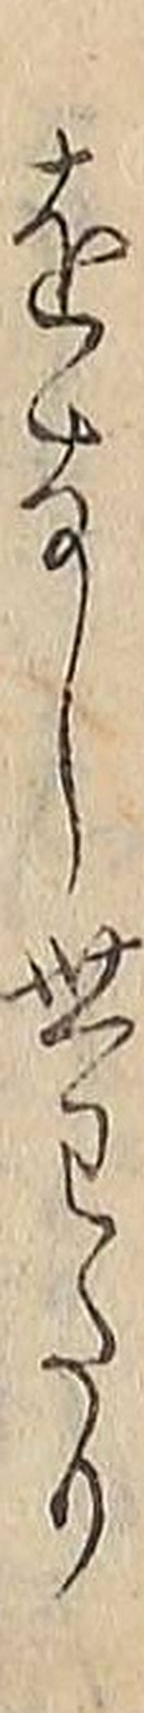をなし世わたり
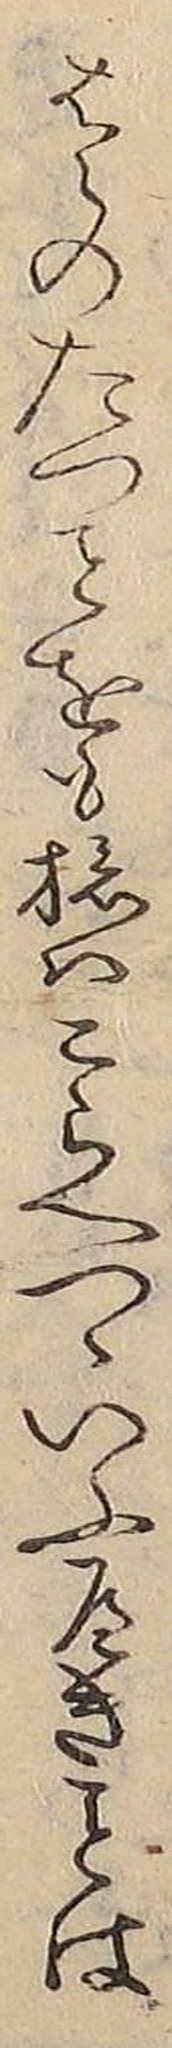はらのたつことをも旅はこらへつゝいふへきことは
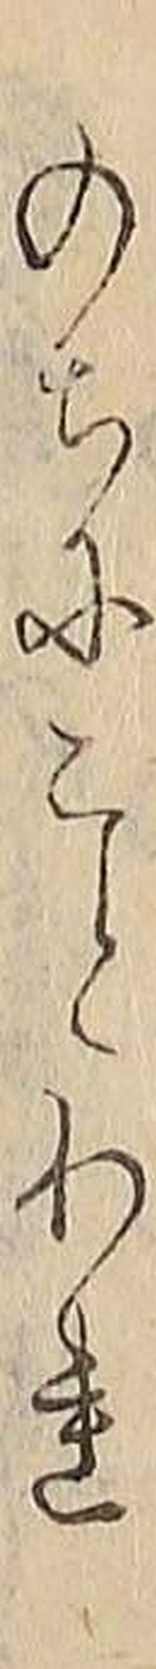のちにことわれ
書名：旅行用心集
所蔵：神戸大学附属図書館 国文学研究資料館
